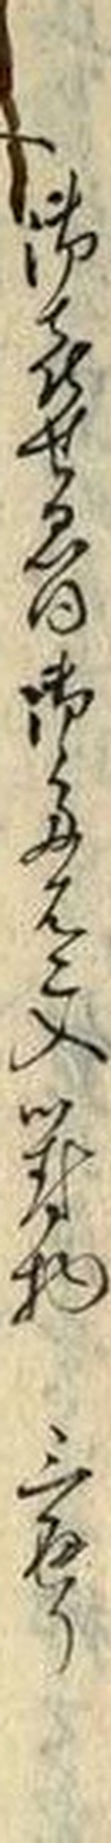御きせる筒御たはこ入御対物三通り
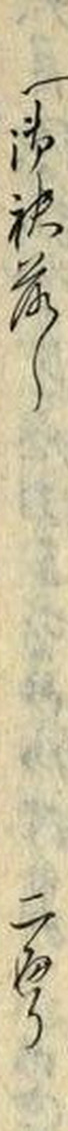御袂落し二通り
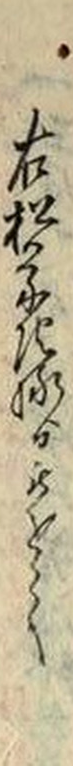右松栄院様ゟ被進之
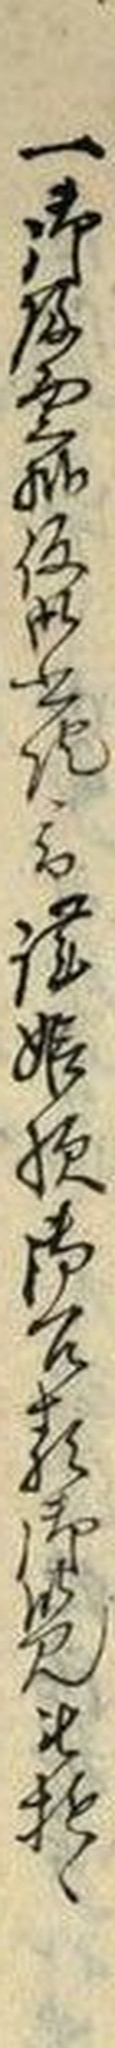一御帰殿掛仮御書院ニ而謹姫様御召類御覧被遊候
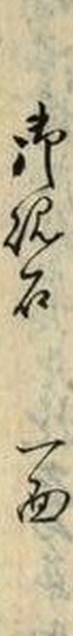御硯石一面
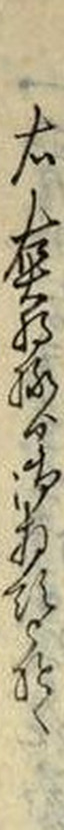右右大将様ゟ御拝領被遊候
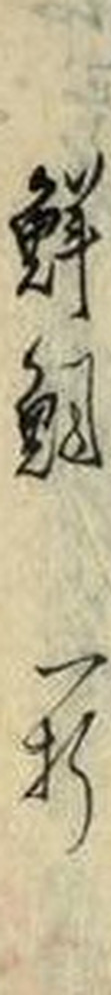鮮鯛一折

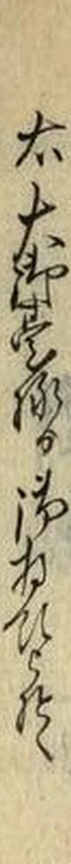右大御台様ゟ御拝領被遊候
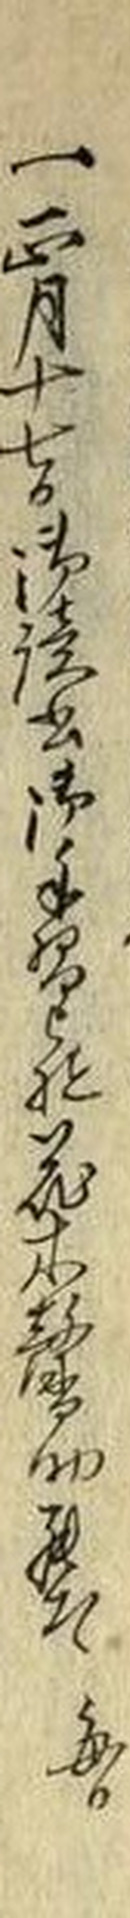一正月十七日御読書御手習被遊花木馨助罷出候毎日
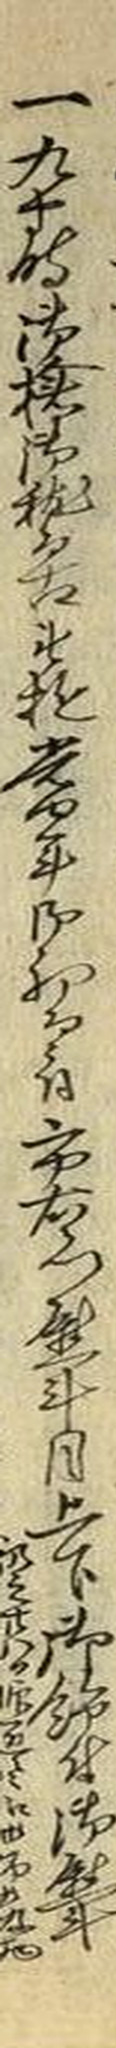一九半時御槍御稽古被遊当年御初而ニ付市右衛門熨斗目上下御飾付御熨斗
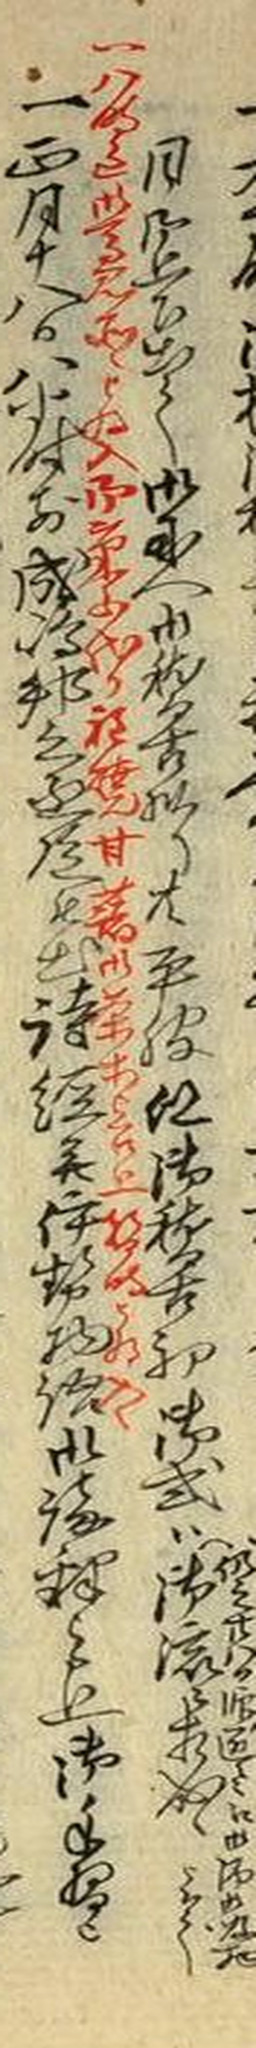一正月十八日八半時前成島邦之丞殿被出詩経并伊勢物語御講釈被申上御手習被
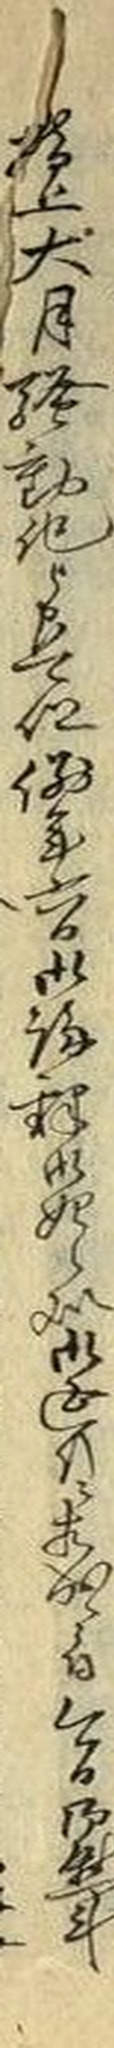指上大月騒動記被申上但例年六日御講釈御始候処御延引ニ相成候ニ付今日御熨斗
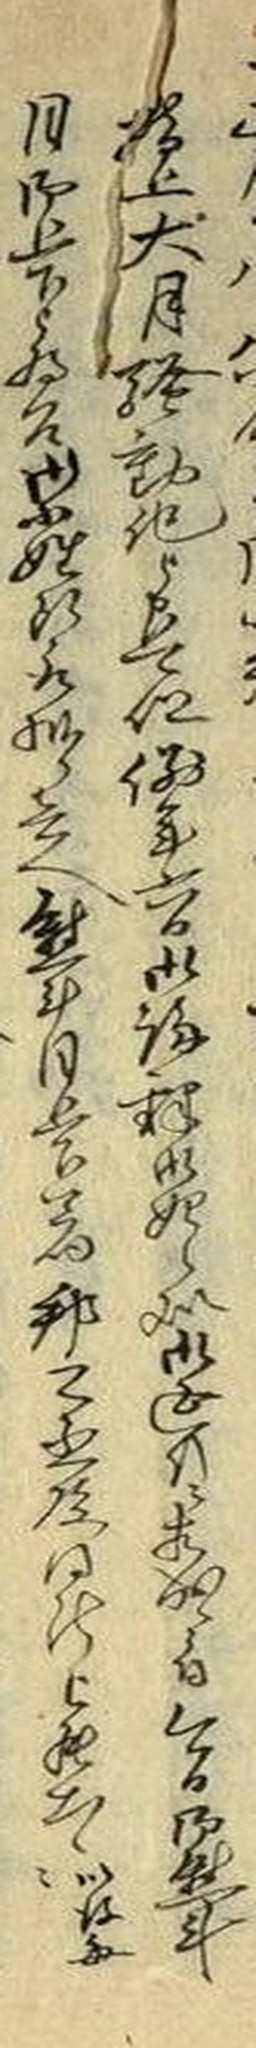目御上下被為召御小姓頭取掛り壱人熨斗目上下着邦之丞殿同断被罷出候以後毎々
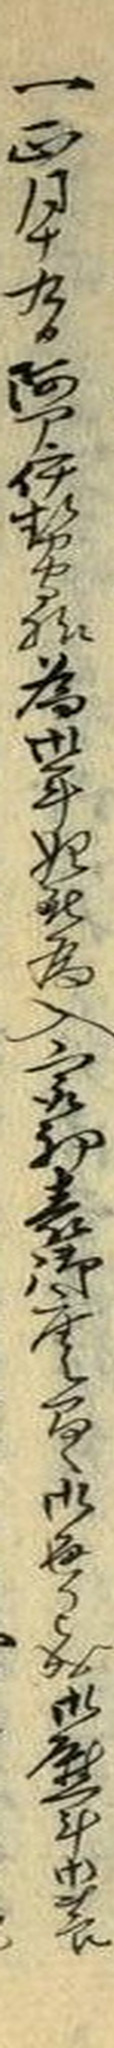一正月十九日阿部伊勢守様為御年始被為入最初表御座之間へ御通り被成御熨斗御莨
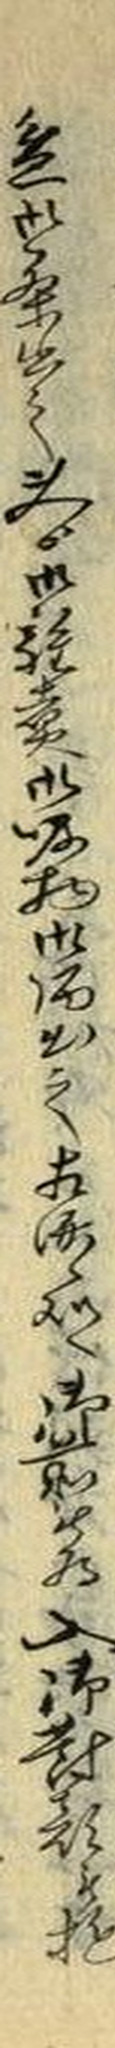盆御茶出之夫ゟ御雑煮御吸物御酒出之相済候処へ御前被為入御対顔被遊
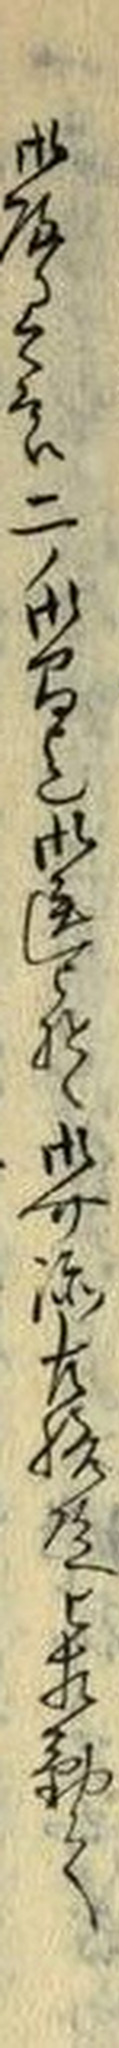御帰り之節二ノ御間迄御送被遊候御介添左膳殿被相勤之
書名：少傅日録抄（斉善付側向頭取日記、江戸并道中、初入在国、逝去後…
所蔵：福井県文書館 Fukui Prefectural Archives
